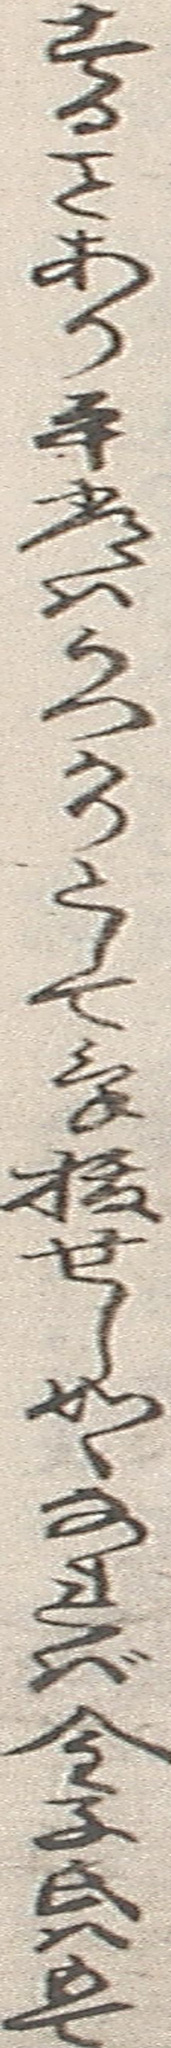することあり平常ハうつかりとして気抜せし如くなれバ金子氏ハもて
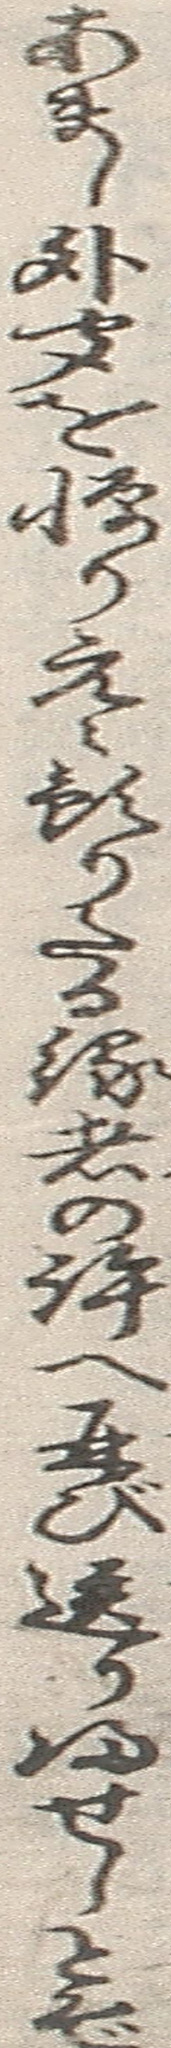あまし外聞を憚り元々預りたる縁者の許へ再び送り帰せしとぞ
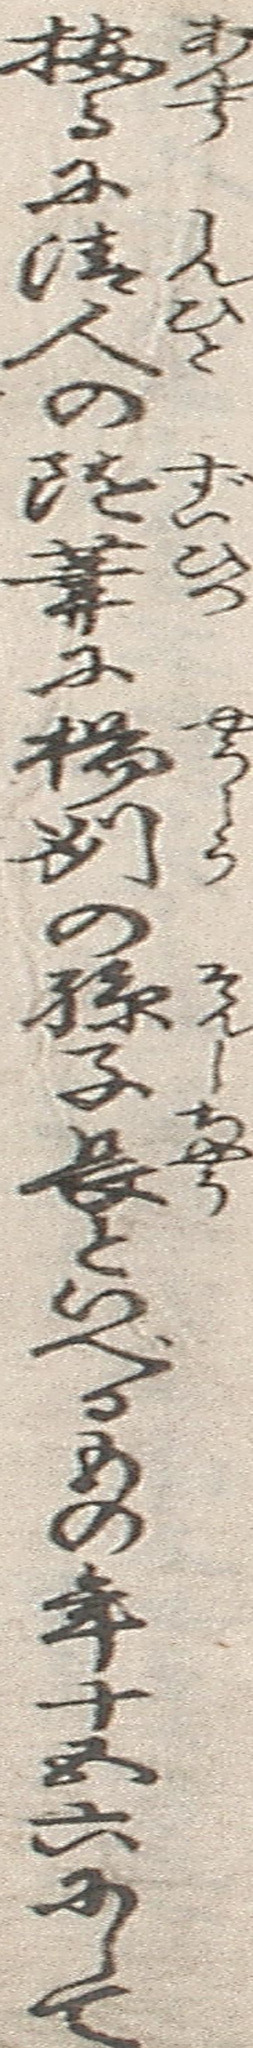按るに清人の随筆に揚州の孫子長といへるもの年十五六にて
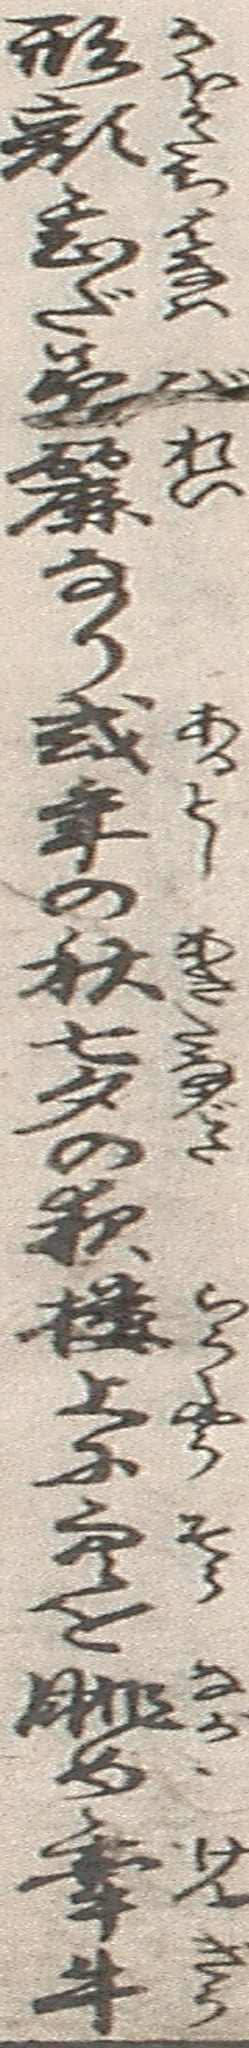形顔甚だ美麗なり或年の秋七夕の夜楼上に空を眺め牽牛
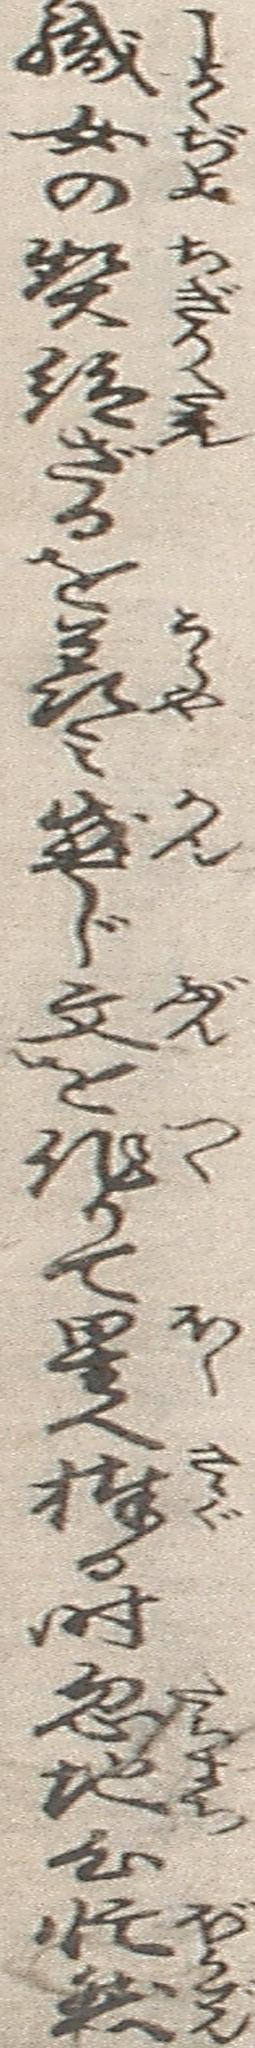織女の契絶ざるを羨ミ感じ文を作りて星へ捧る時忽地心茫然

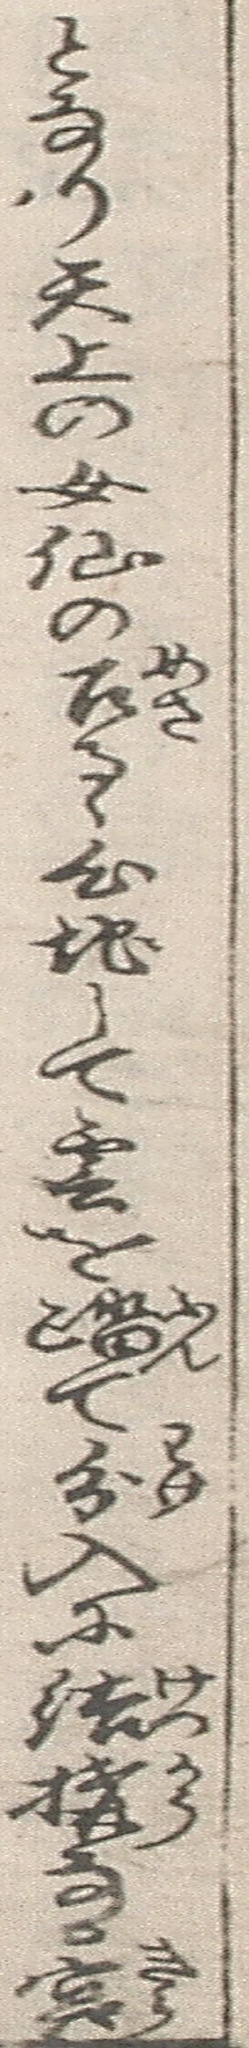となり天上の女仙の召るゝ心地して雲を踏て分入に結構なる宮
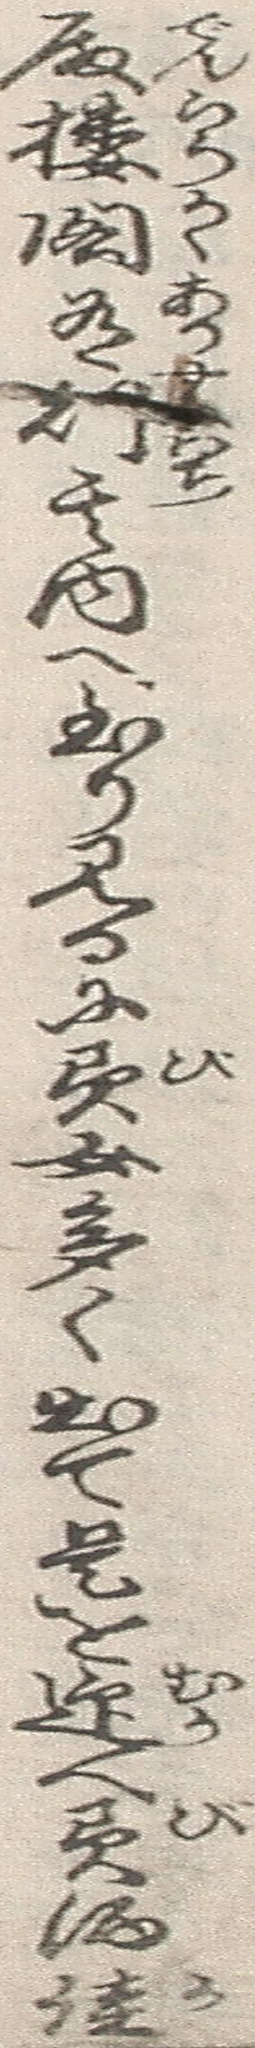殿楼閣有即其内へ至り見るに美女多く出て是を迎へ美酒佳
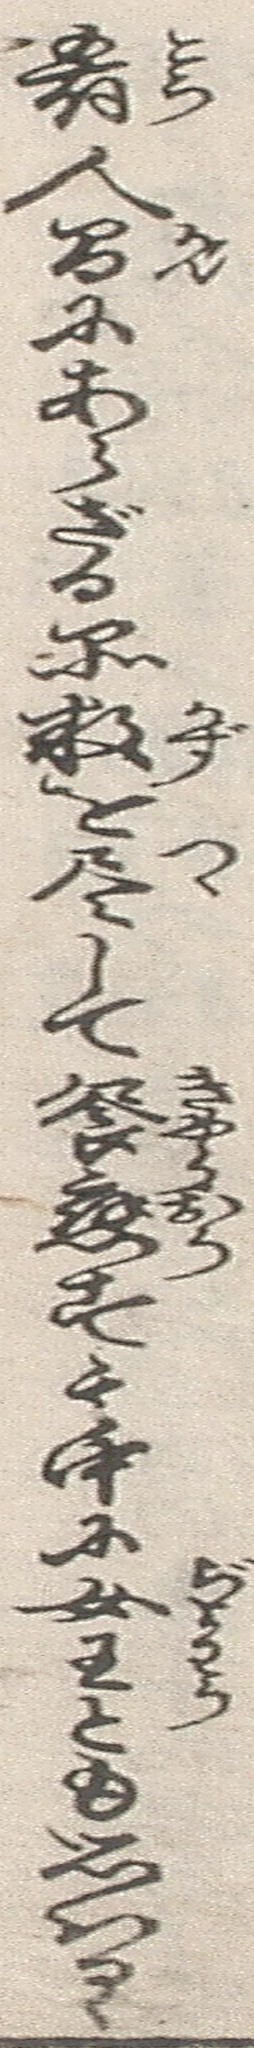肴人間に有らざる品数を尽して饗応す其中に女王とも思ハるゝ
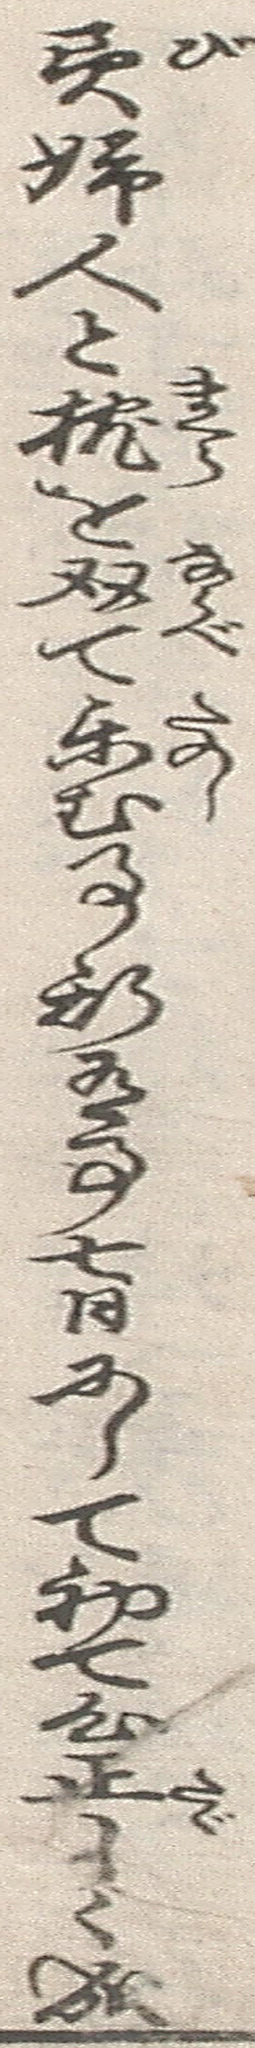美婦人と枕を双て楽む事斯有事七日にして初て心正しく成
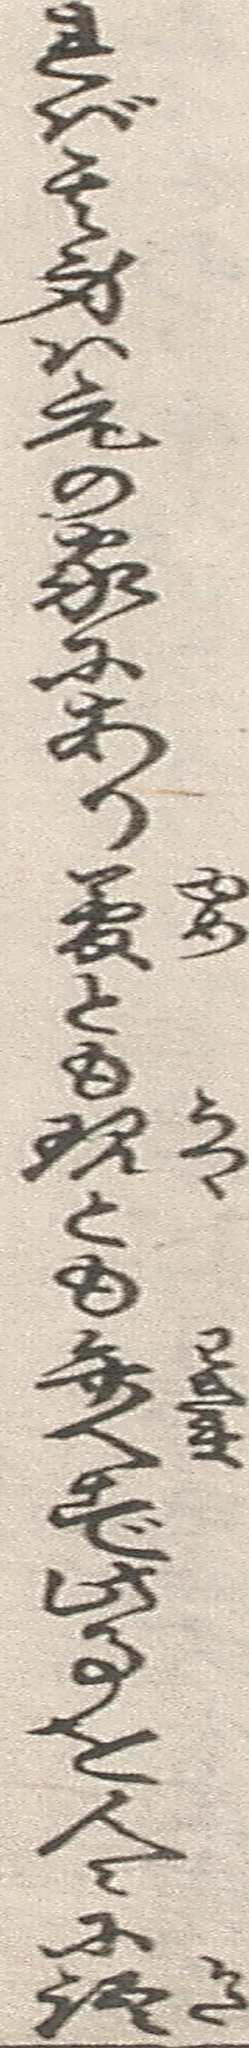れバ其身ハ元の家にあり夢とも現とも弁へず此事を人々に語
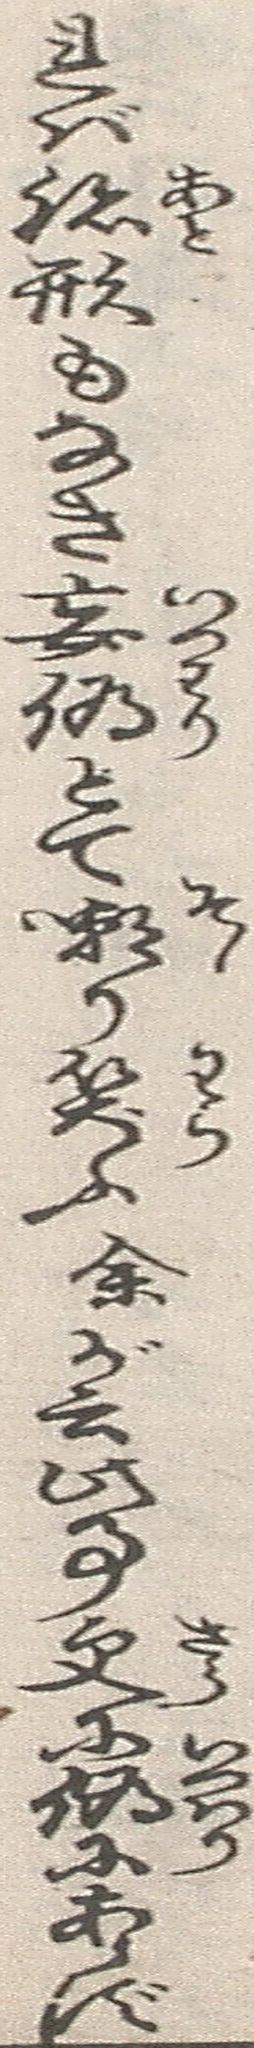れバ跡形もなき妄偽とて嘲り笑ふ余が云此事更に偽にあらず
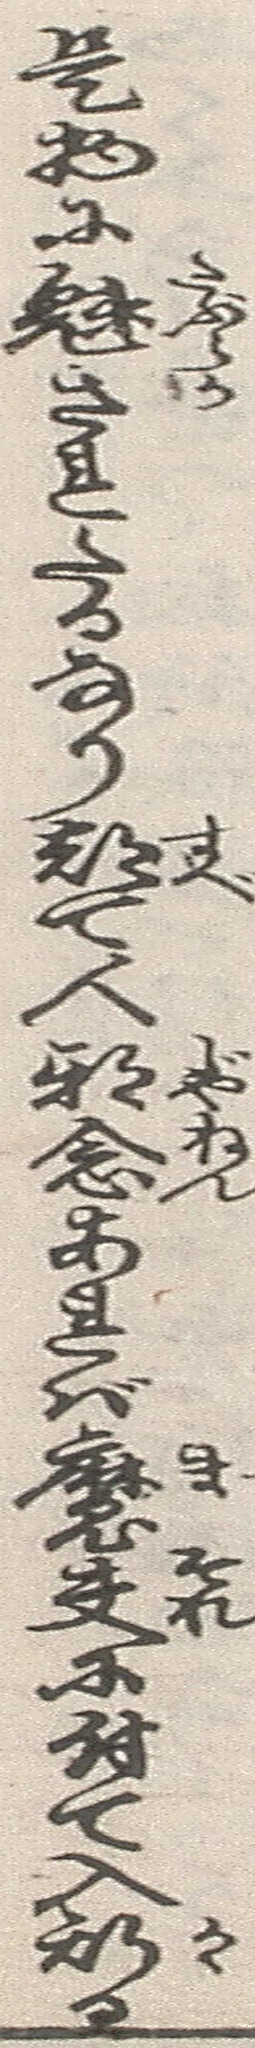是物に魅されたるなり都て人邪念あれバ魔夫に付て入斯る
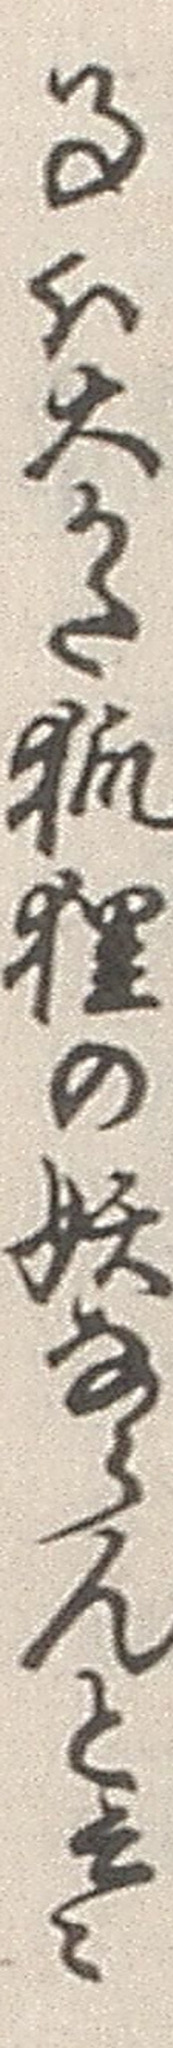事ハ大かた狐狸の妖ならんと云々
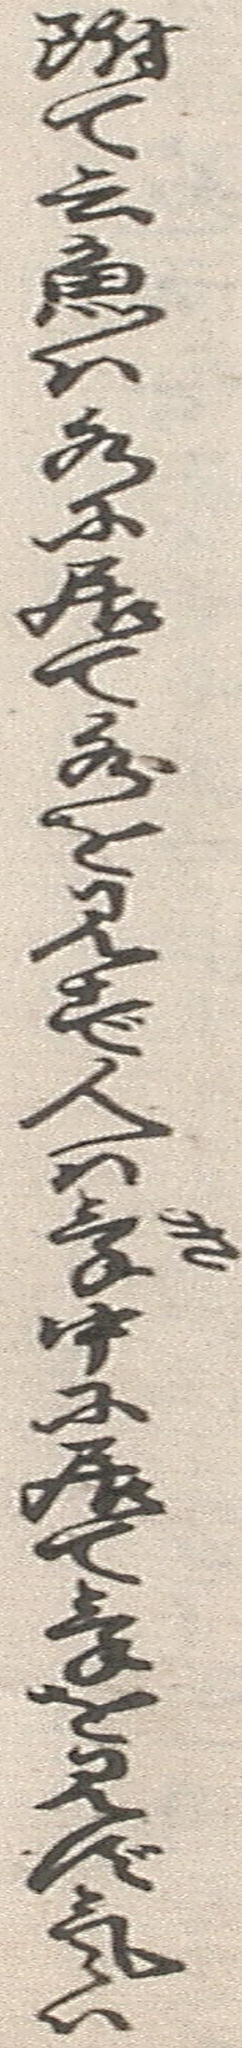附て云魚ハ水に居て水を見ず人ハ気中に居て気を見ず気ハ
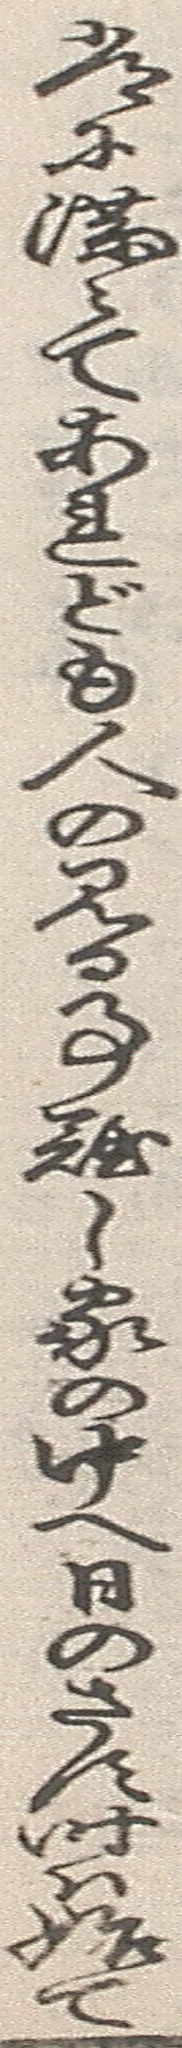常に満々てあれども人の見る事難し家の中へ日のさす時ハ始て
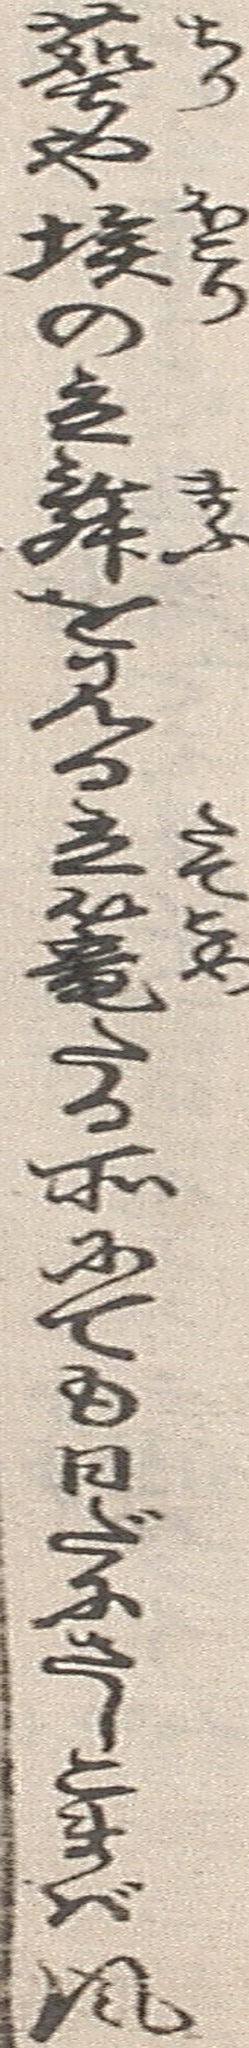塵や埃の立舞を見る立篭たる所にても日だにさしこまバ風
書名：安政風聞集　上中下　全
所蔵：東京大学地震研究所図書室 Earthquake Research Institute Library, The University of Tokyo, JAPAN
